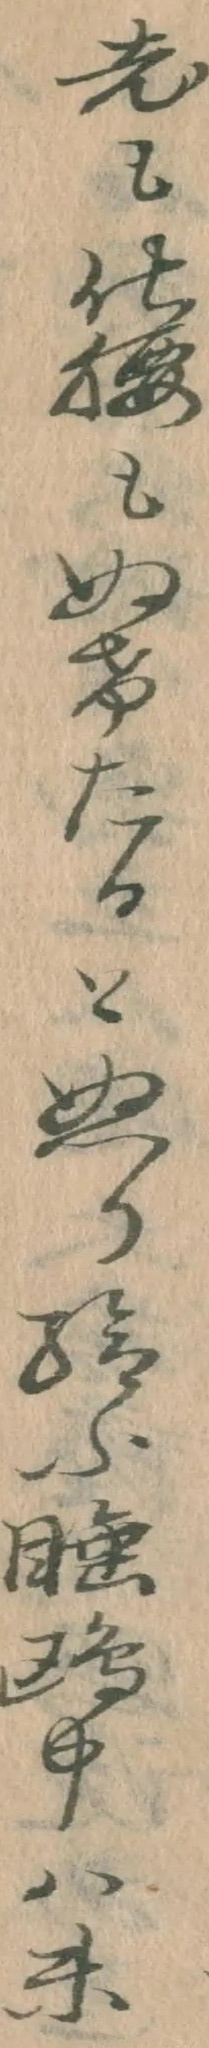老も仕腰もぬ希たると怒り給ふ睡鴎申は未
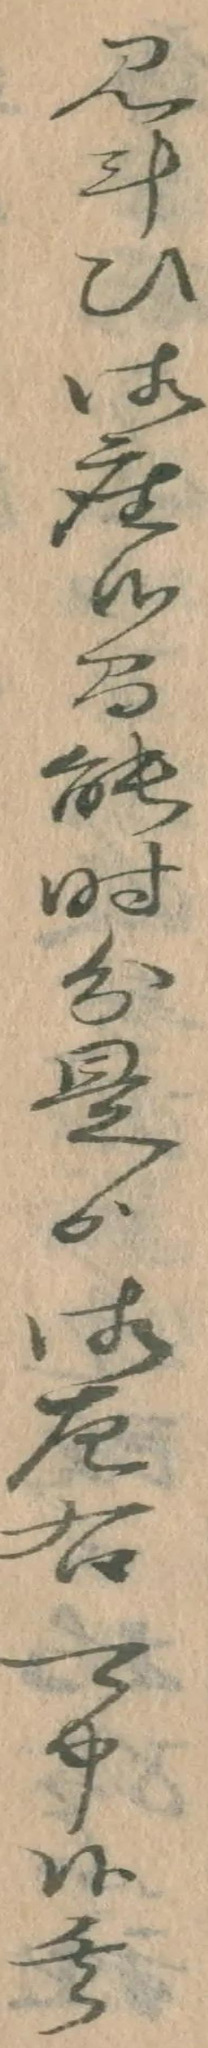見斗ひ御座候間能時分是ゟ御左右可申候其
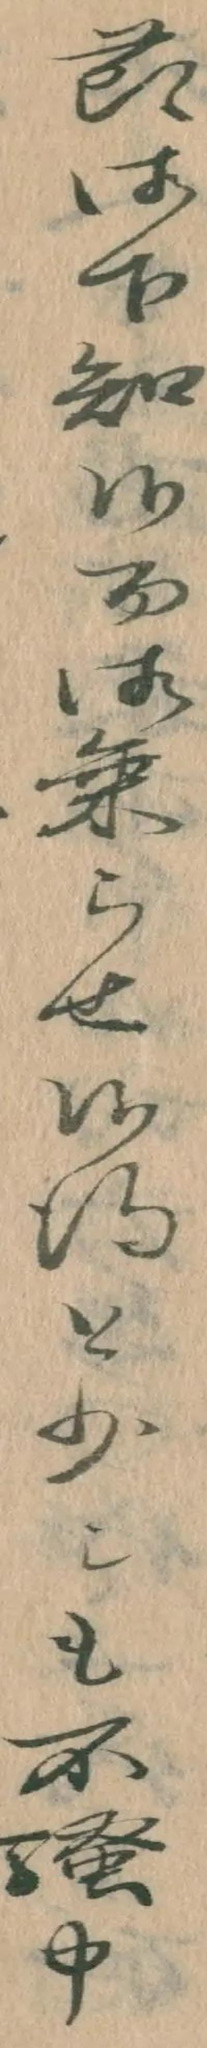節御下知候而御乗らせ候得と少しも不騒申
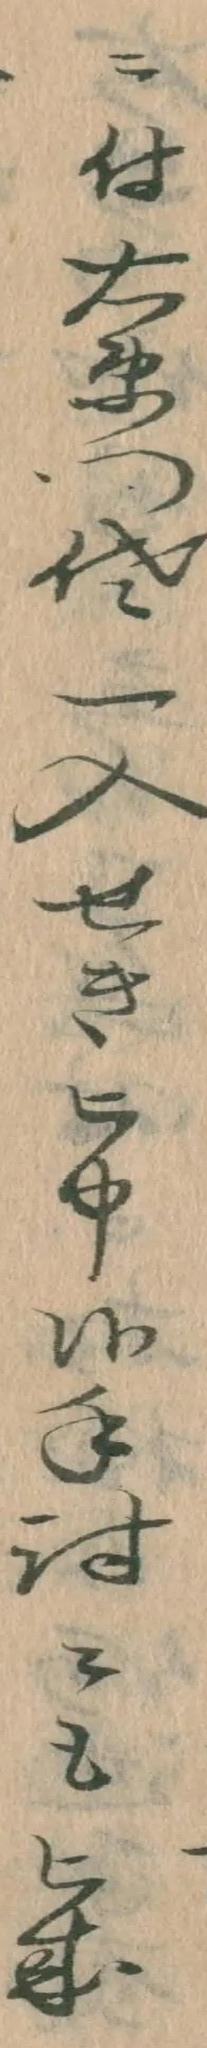に付右衛門佐一人せき被申候手討にも被成
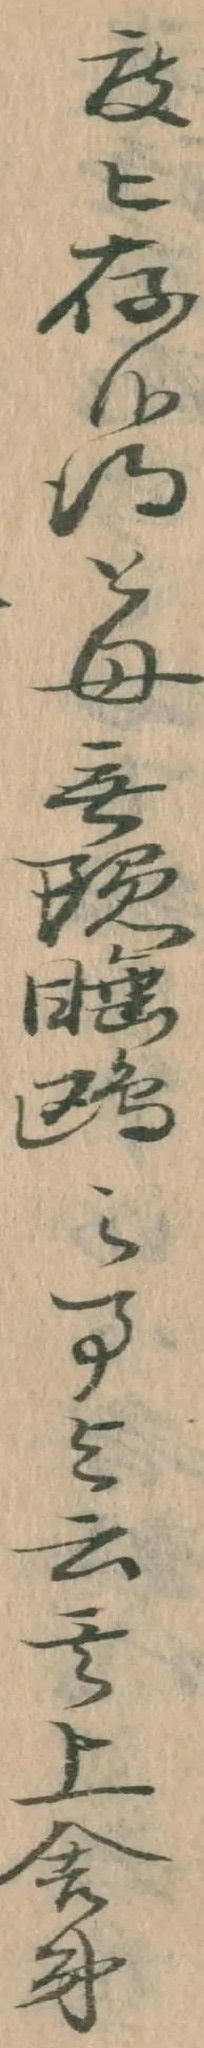度被存候得と母無隠睡鴎之事与云其上舎弟
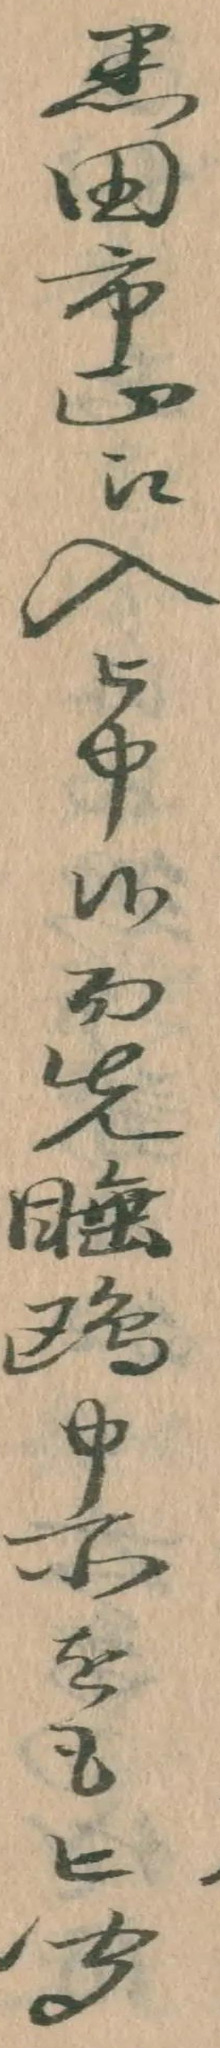黒田市正江入被申候而先睡鴎申所をも被聞
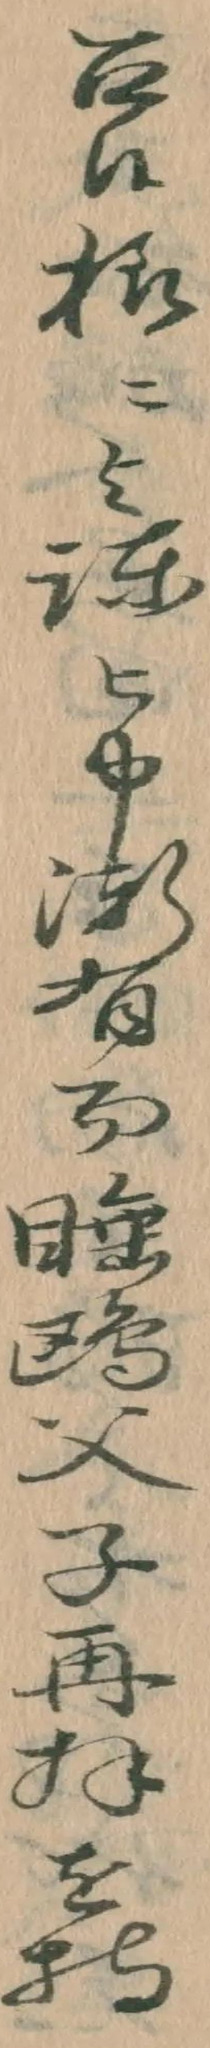召候様に与諫被申漸有而睡鴎父子再拝を持
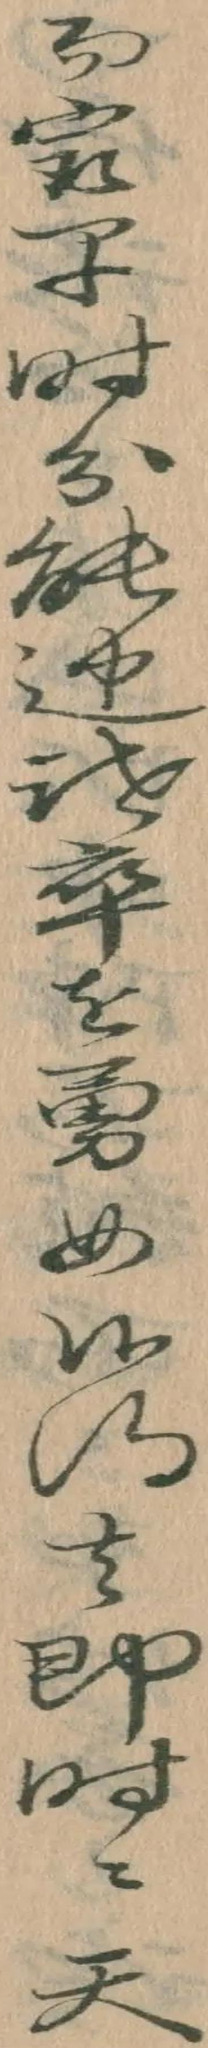而最早時分能迚諸卒を勇め候得者即時に天
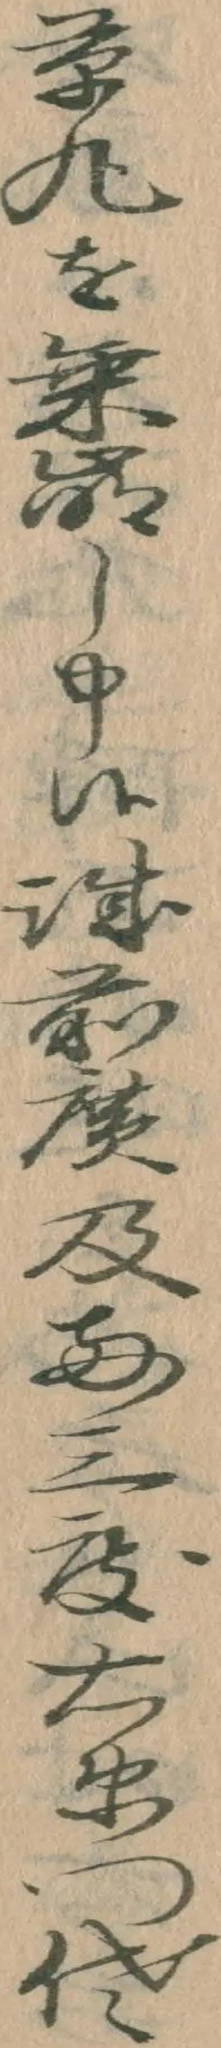草丸を乗崩し申候誠前広及両三度右衛門佐
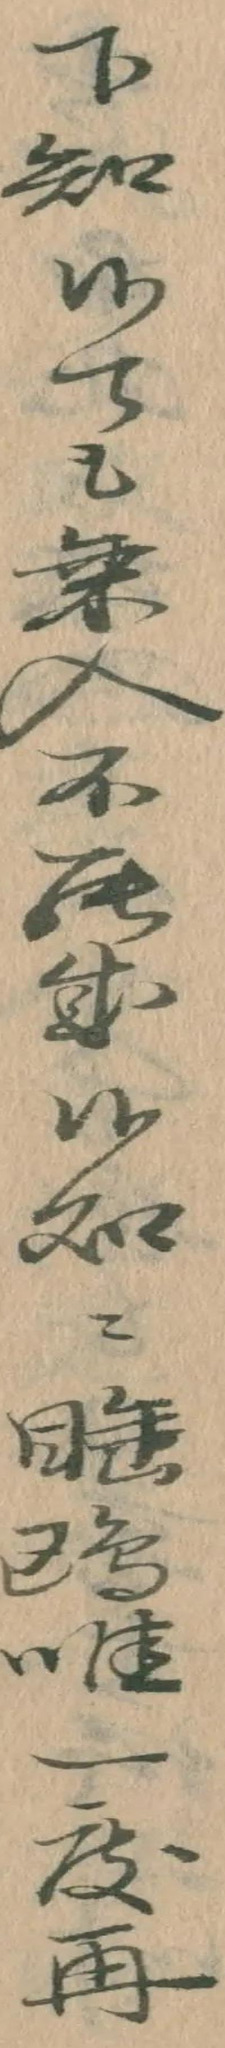下知候ても乗入不罷成候処に睡鴎唯一度再
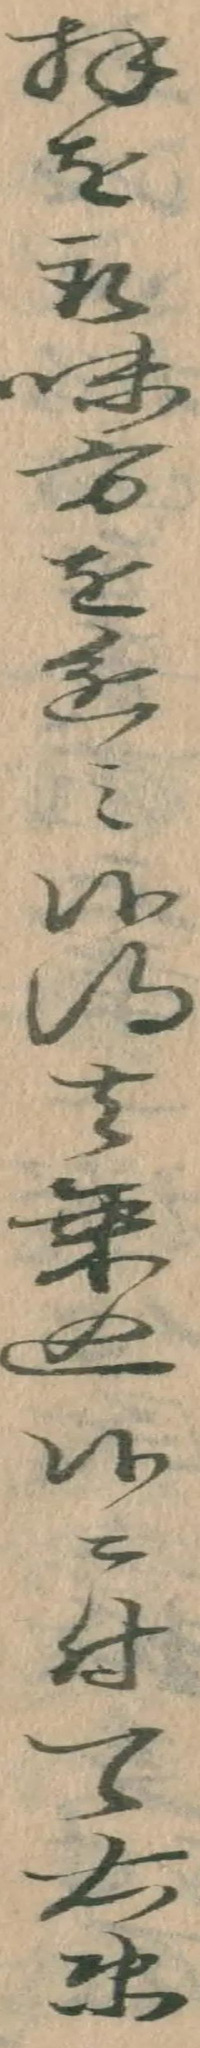拝を取味方を進み候得者乗込候に付て右衛
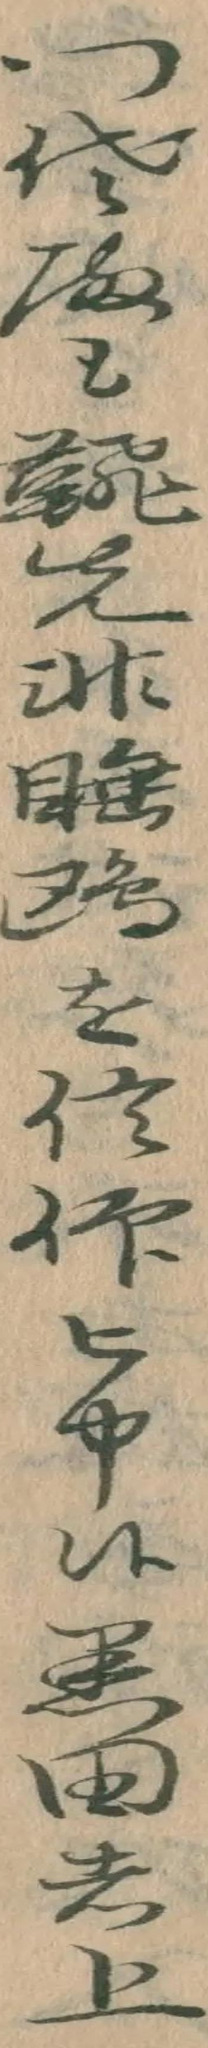門佐殿も飜先非睡鴎を信仰被申候黒田者上
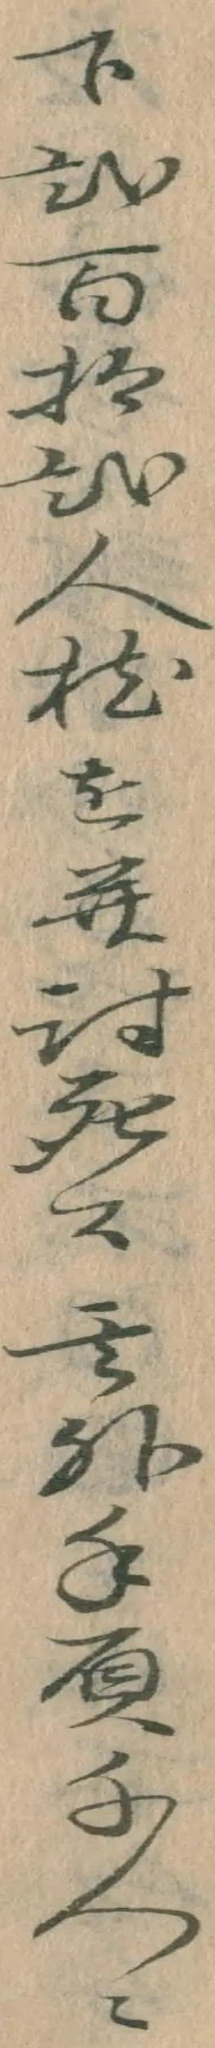下弐百拾弐人枕を並討死す其外手負千人に
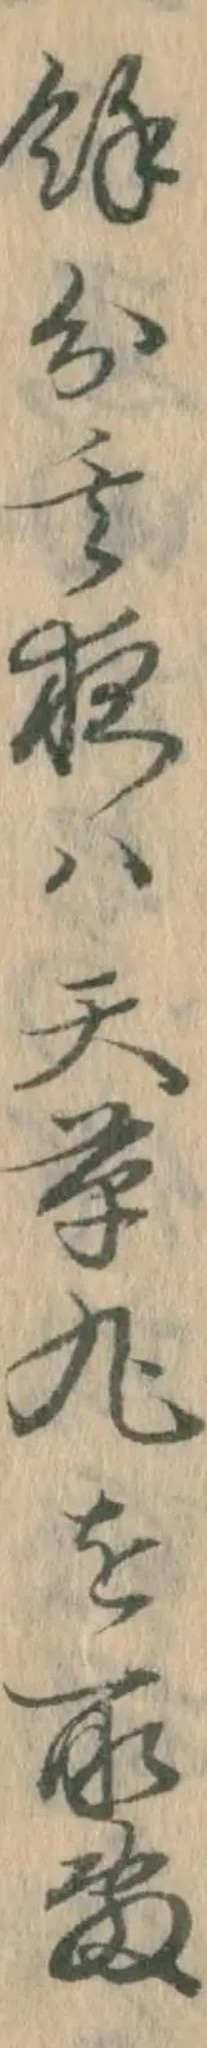余分其夜は天草丸を取敷
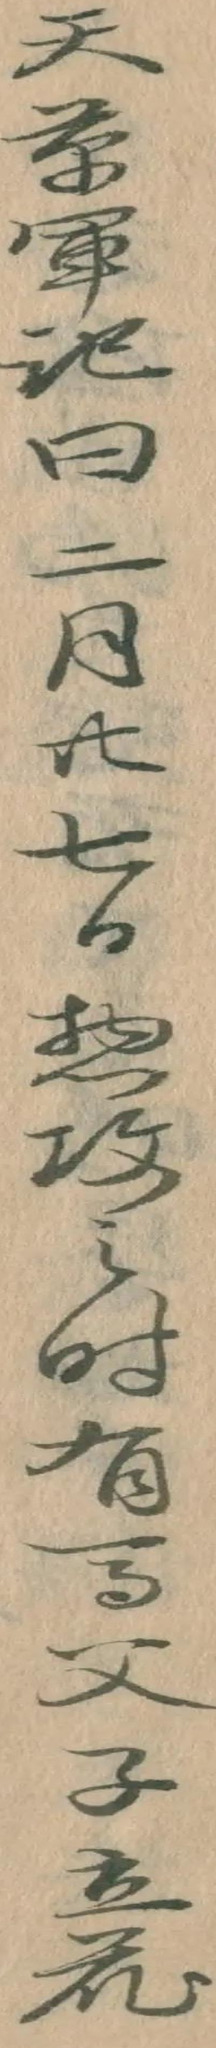天草軍記曰二月廿七日惣攻之時有馬父子立花
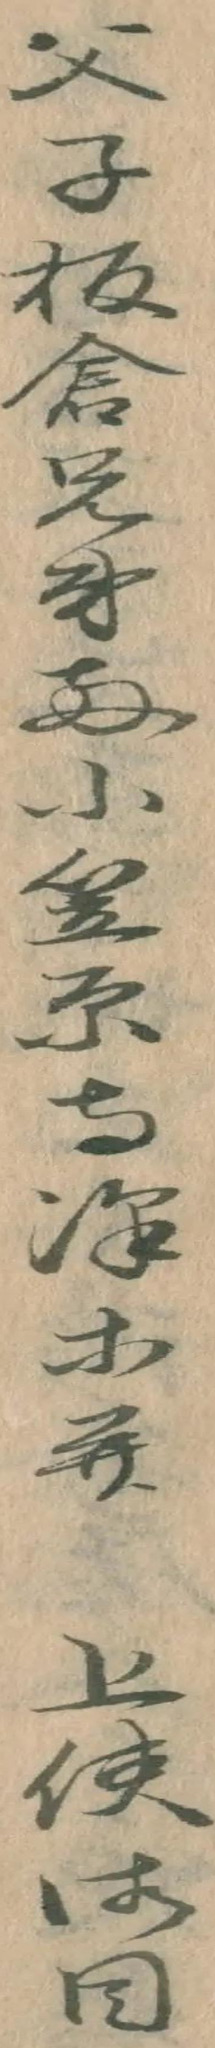父子板倉兄弟両小笠原寺沢等幷上使御目
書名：切支丹御退治記 49巻. [7]
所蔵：国立国会図書館 National Diet Library, JAPAN
